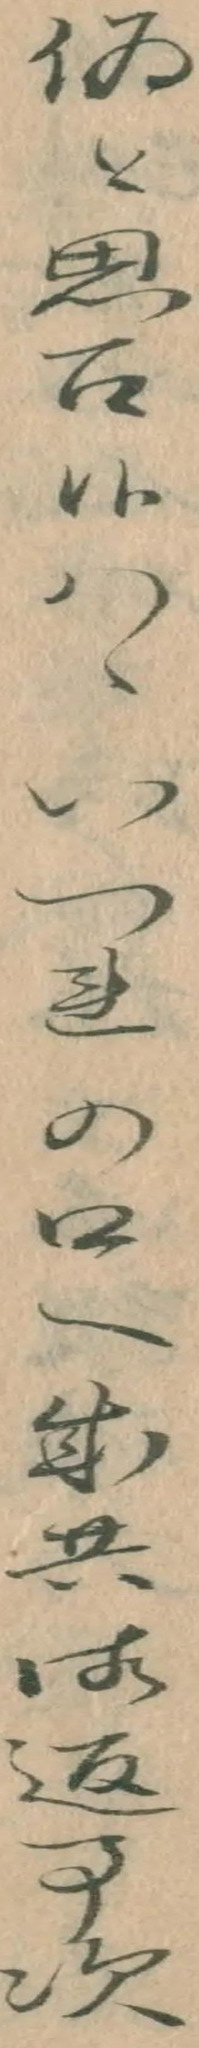偽と思召候はゝいつ連の口へ成共御返事次
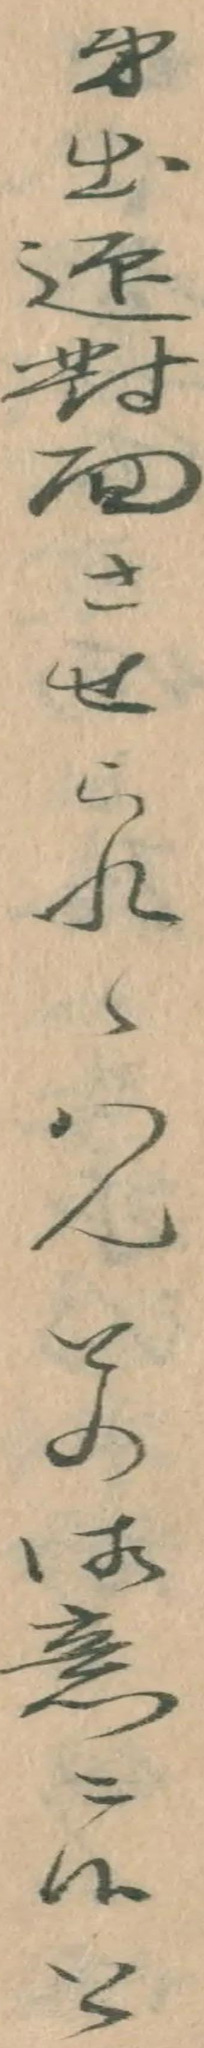第出迎対面させられ候はんとの御意に候と

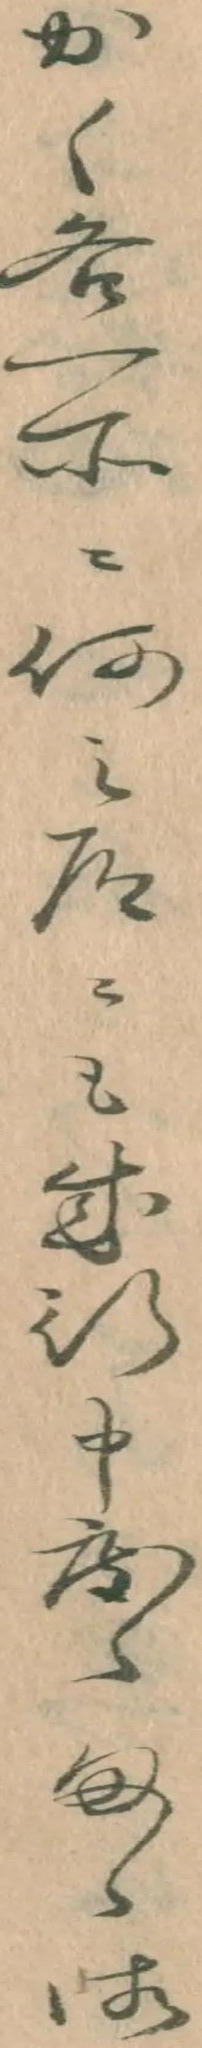かく各一所に何之道にも成行申度々満々御
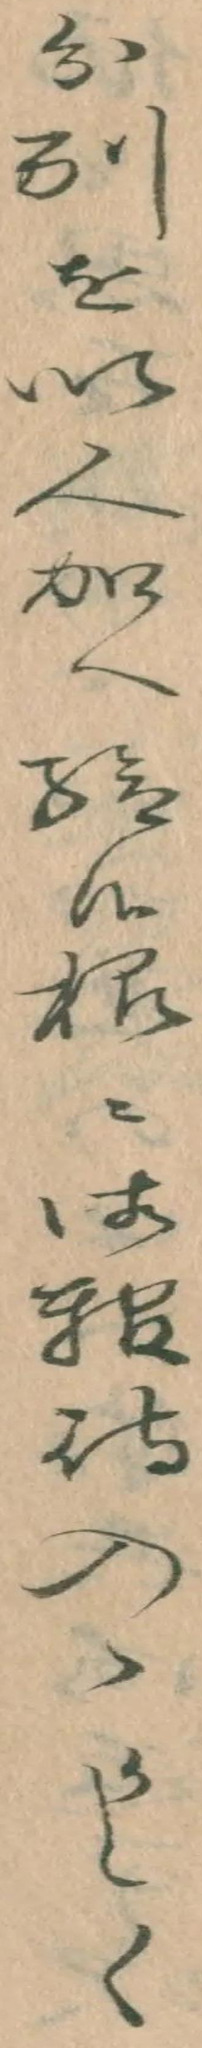分別を以人加へ給候様に御報待入候かしく
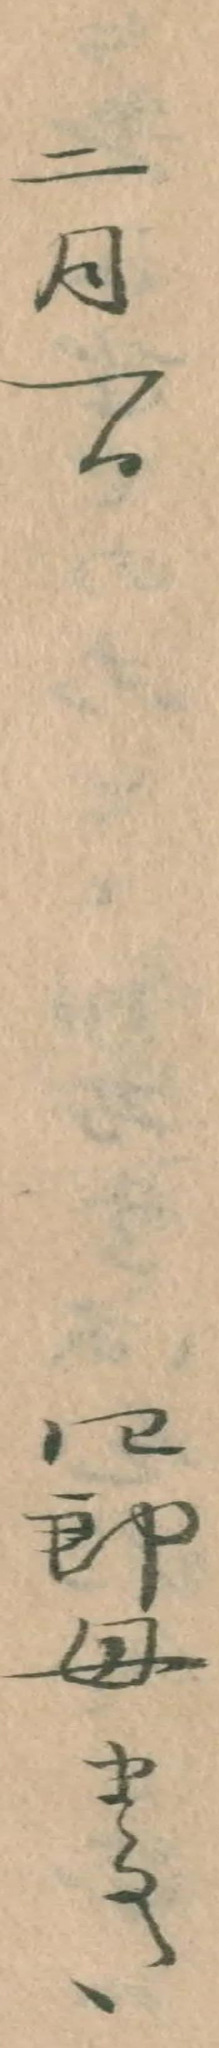二月一日四郎母まるた
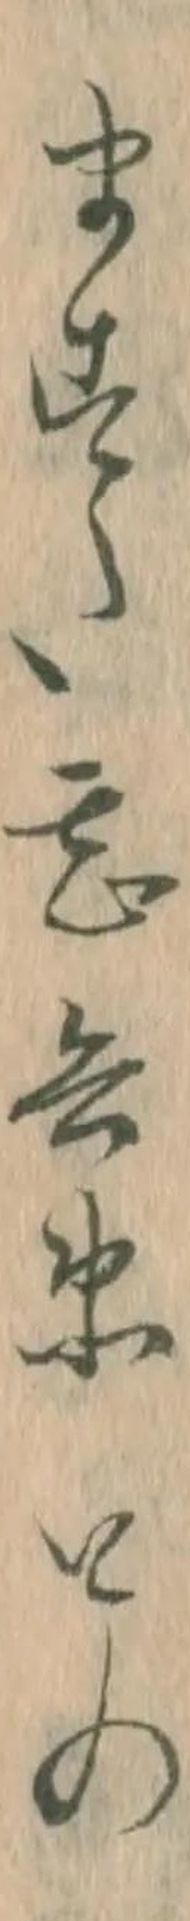ま春た甚兵衛との
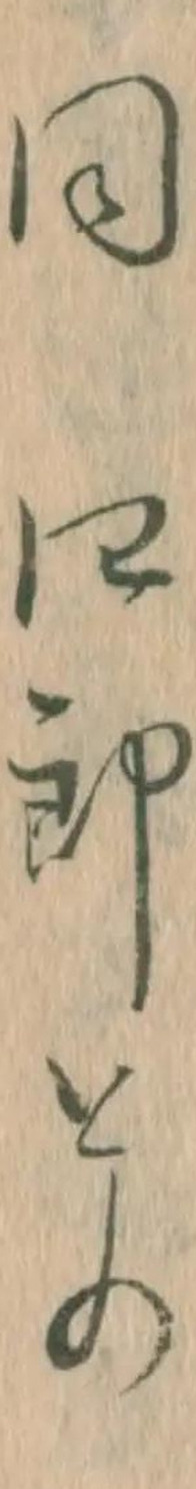同四郎との
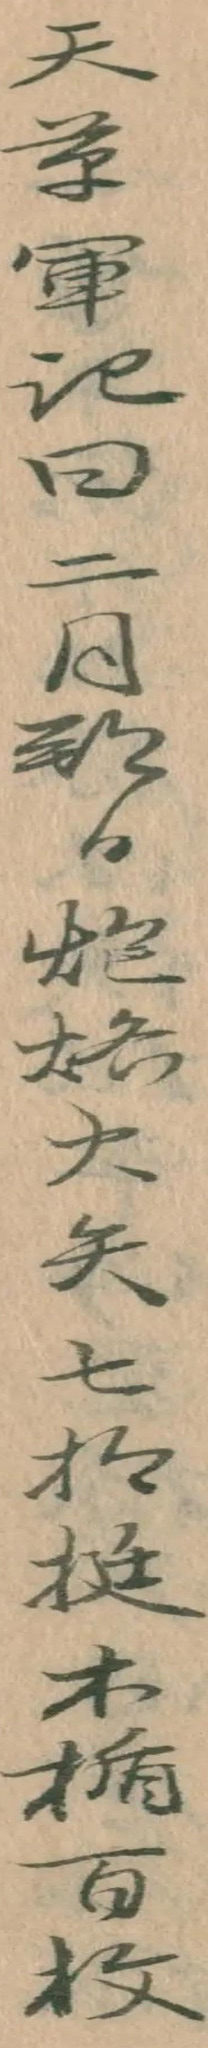天草軍記曰二月朔日炮烙火矢七拾挺木楯百枚
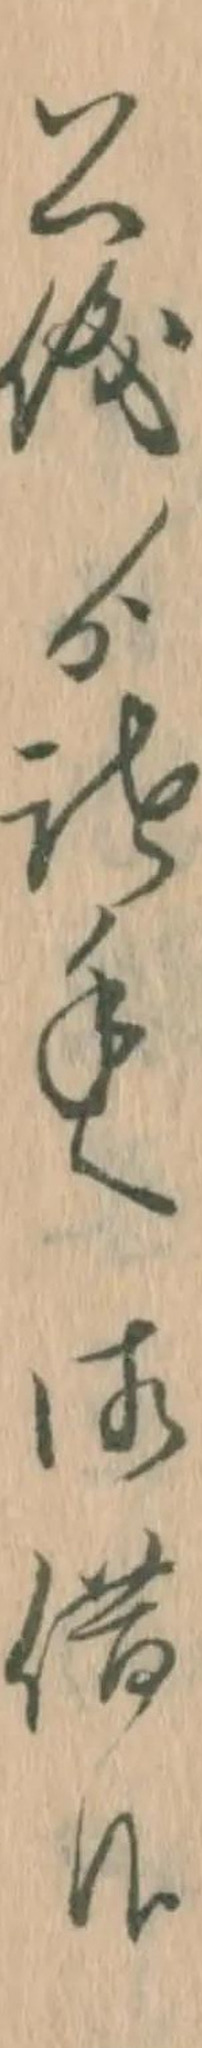公儀ゟ諸手へ御借候
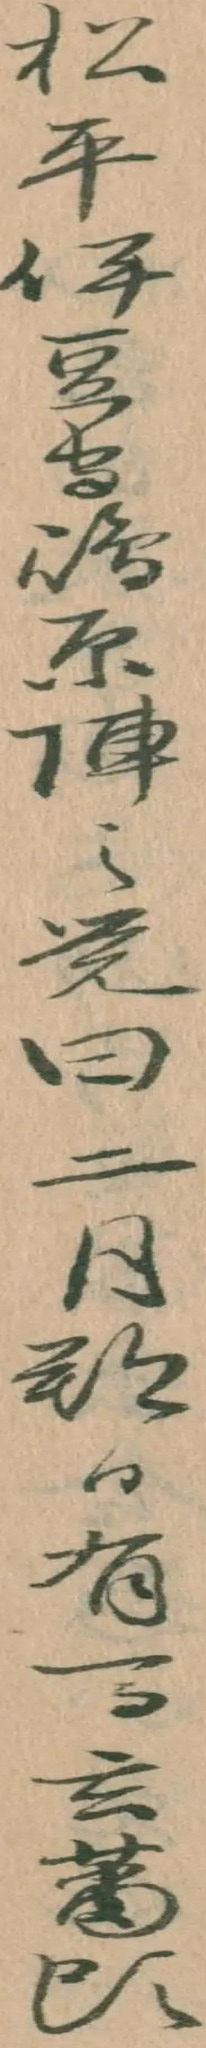松平伊豆守島原陣之覚曰二月朔日有馬玄蕃頭
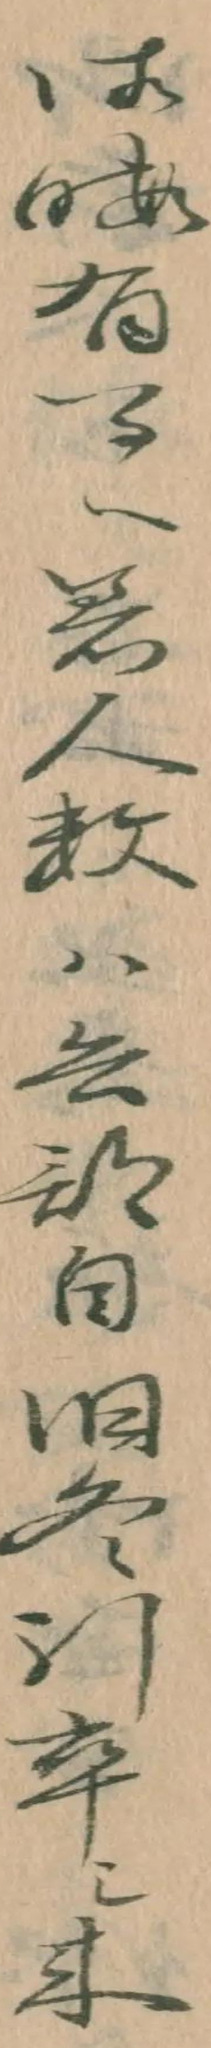御暇有馬へ着人数は兵部自旧冬引卒し来
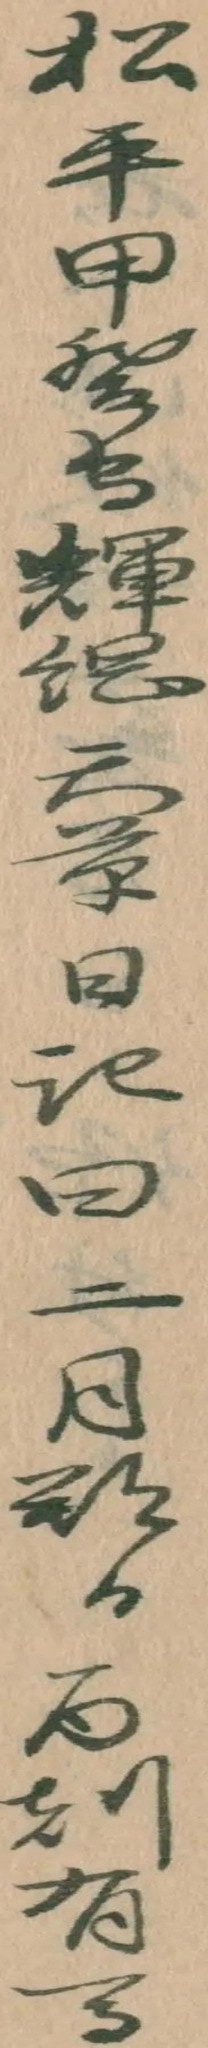松平甲斐守輝綱天草日記曰二月朔日酉刻有馬
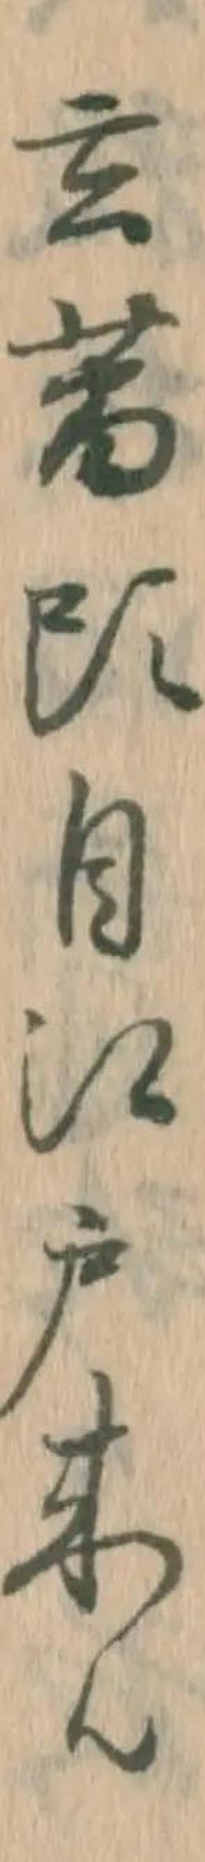玄蕃頭自江戸来る
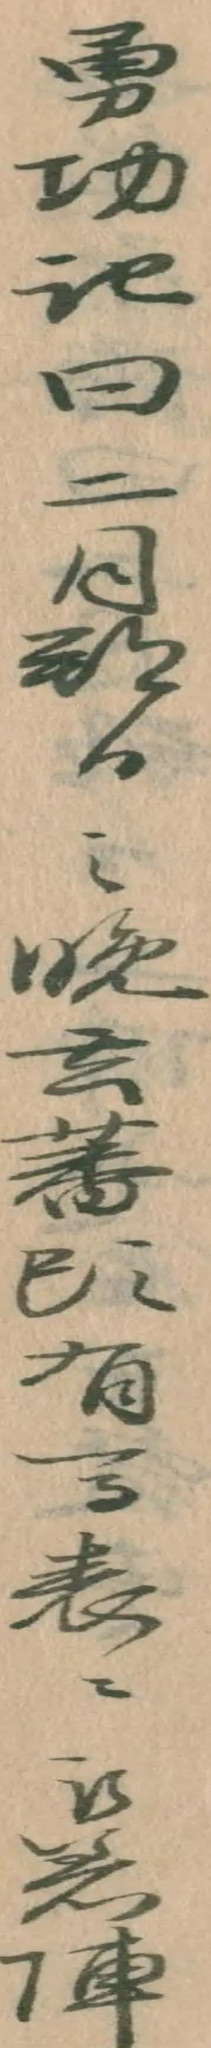勇功記曰二月朔日之晩玄蕃頭有馬表に被着陣
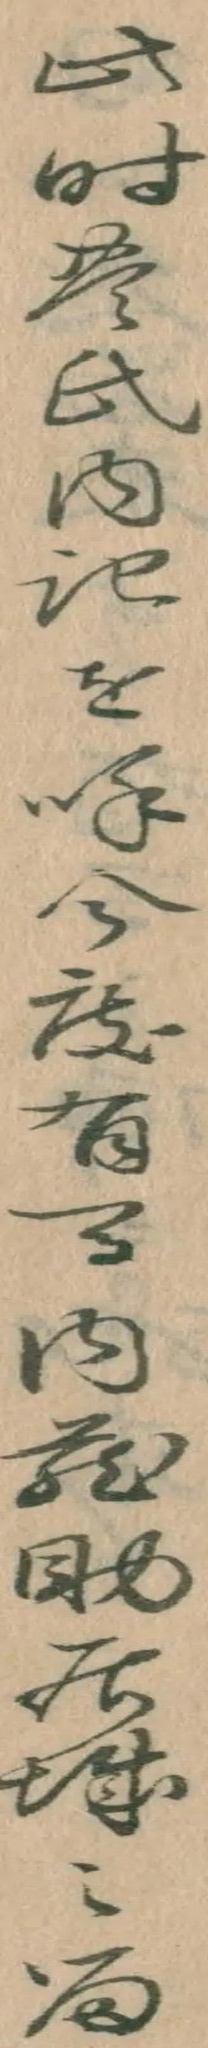此時豊氏内記を呼今度有馬内蔵助居城之留
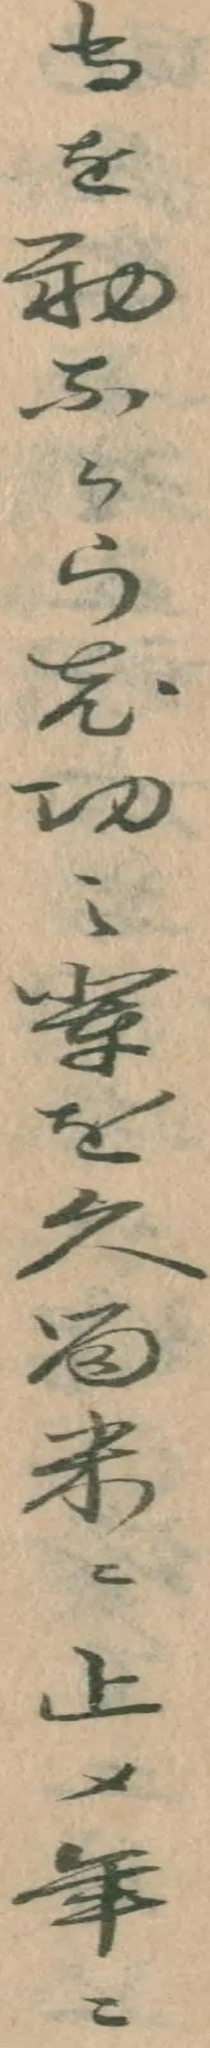守を勤なから先功之輩を久留米に止め年に
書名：切支丹御退治記 49巻. [6]
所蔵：国立国会図書館 National Diet Library, JAPAN
